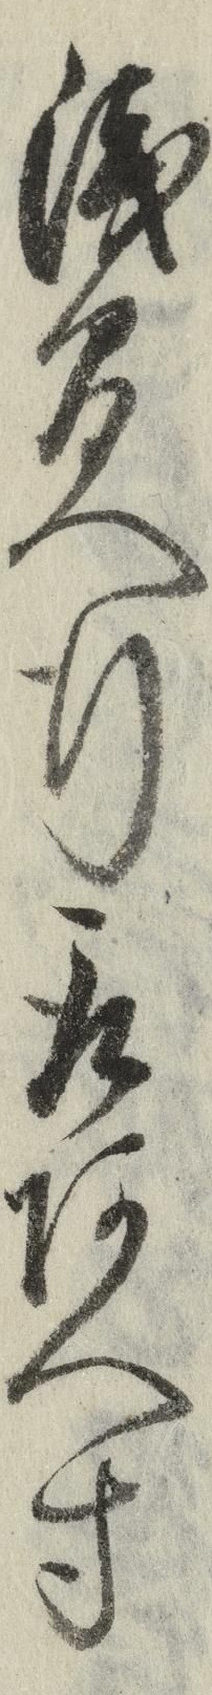浅間へ行取あへす
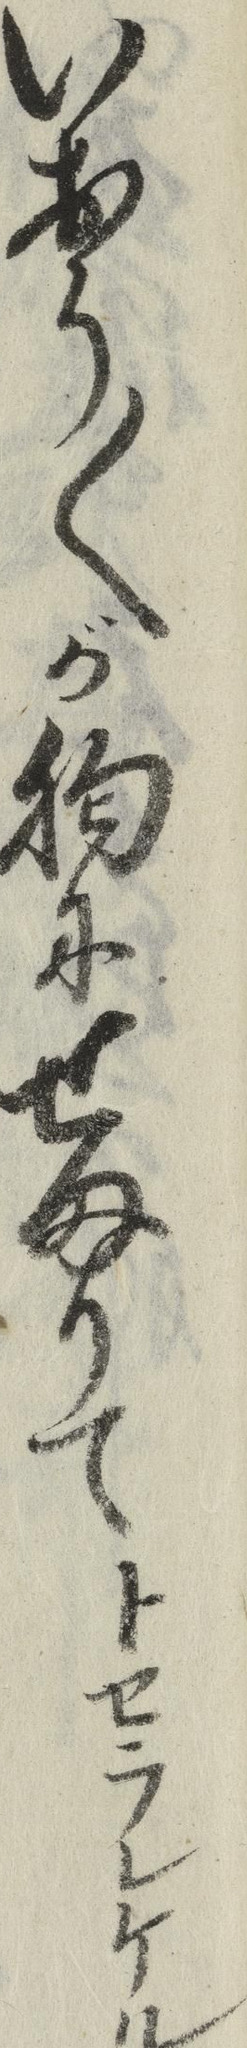いおう〳〵が胸にせまりてトセラレケル
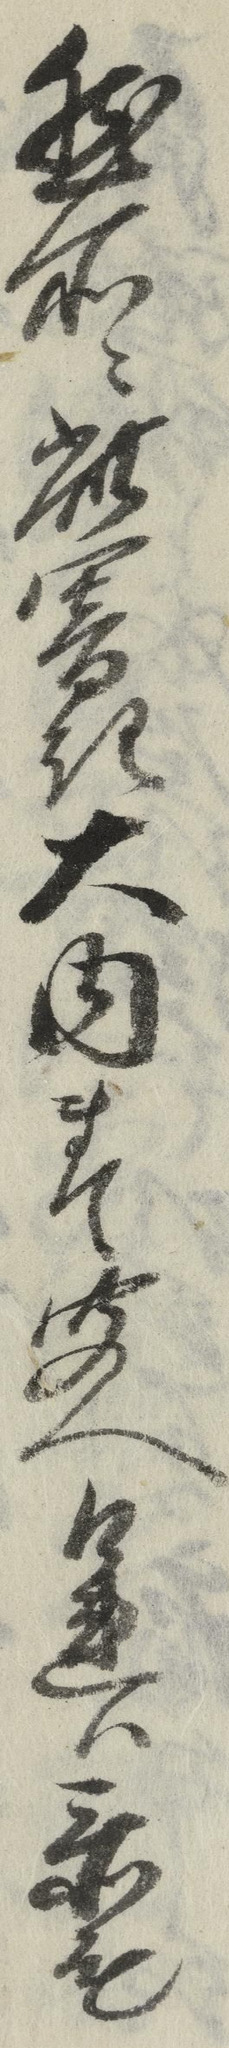然所に此害記大内まて聞へけれは所も
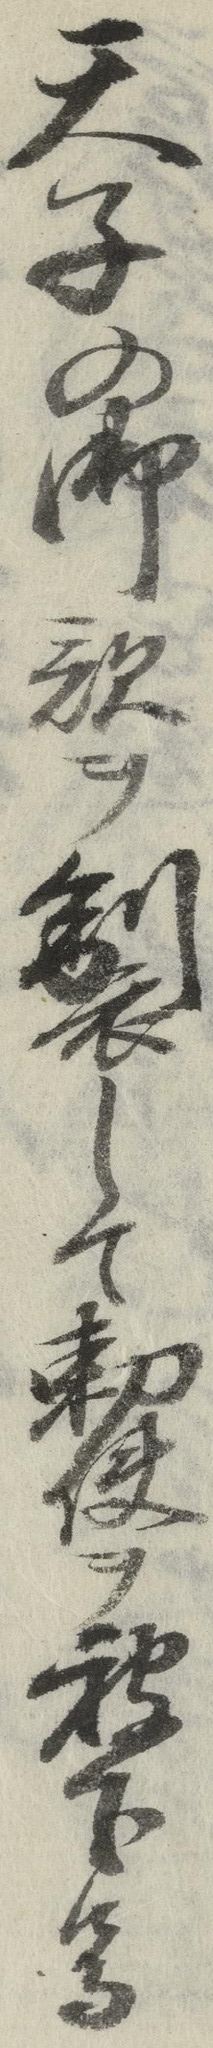天子の御歌ヲ製して勅使ヲ被下ける
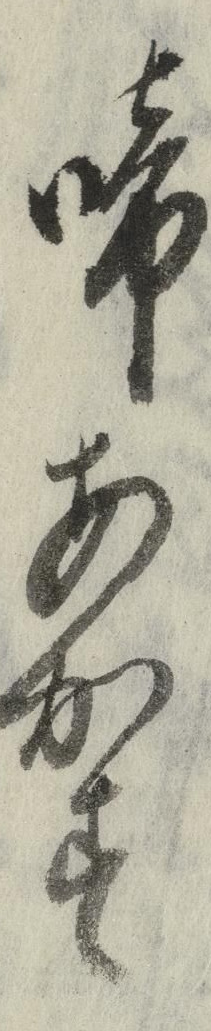啼あかす
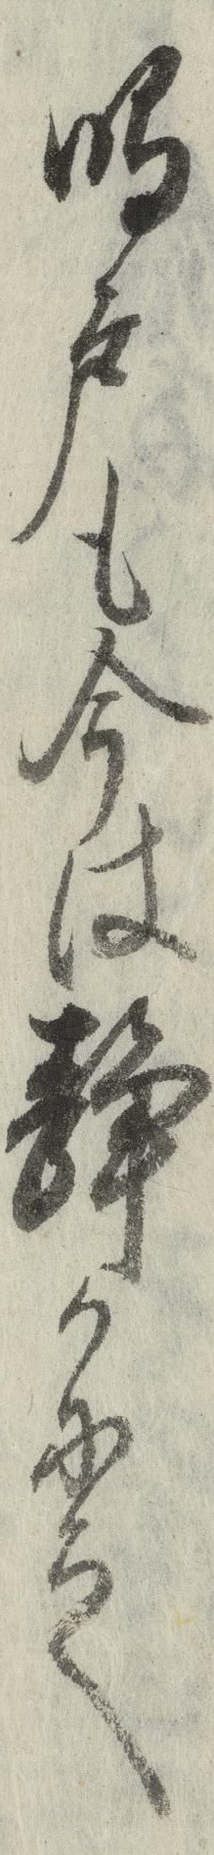鳴戸も今は静かにて
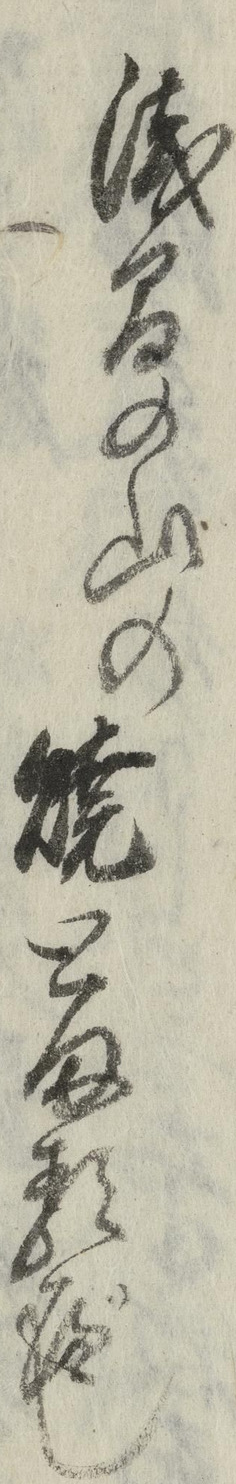浅間の山の焼とまるべし
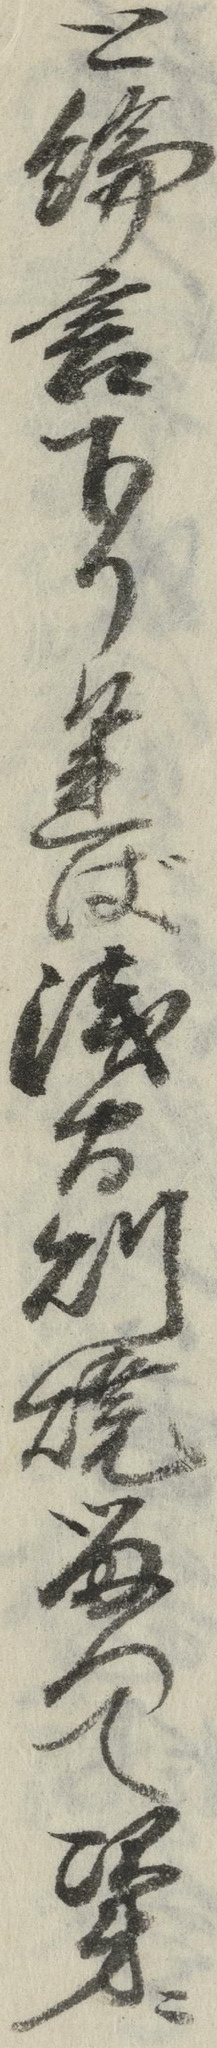と綸言下りければ浅間則焼留つて次第に

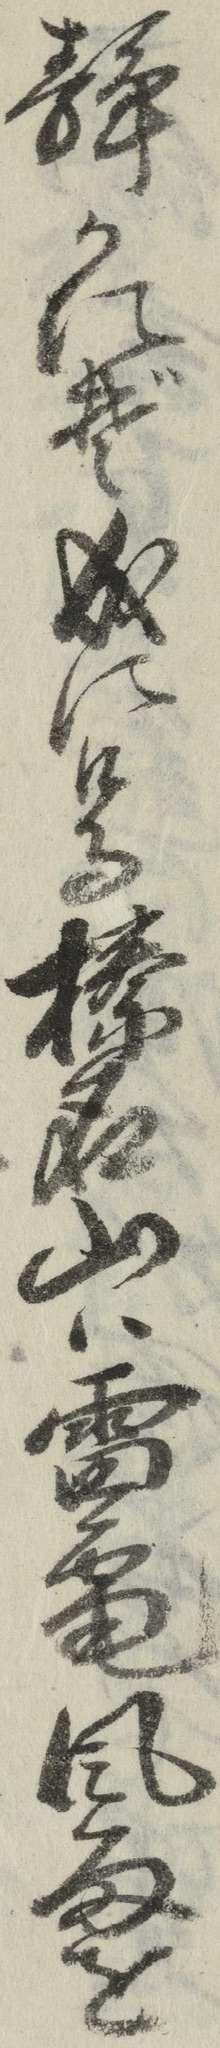静かにぞ成にける榛名山は雷電風雨を
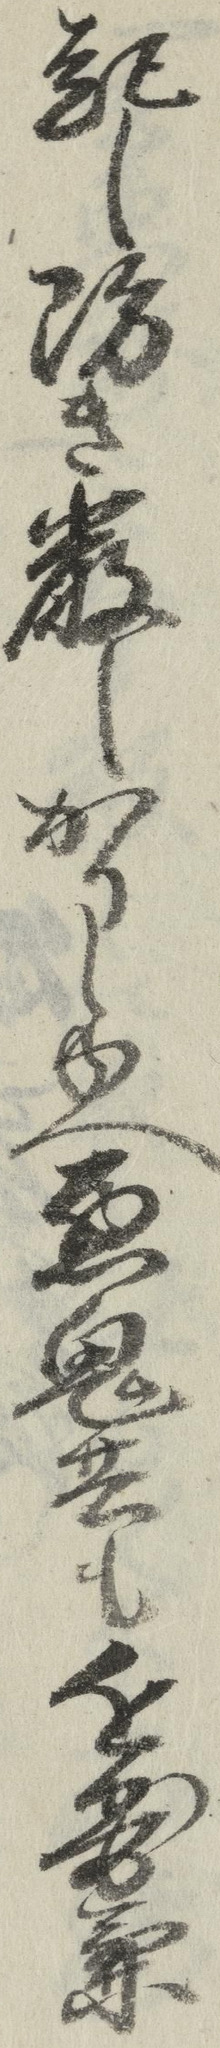起し防き厳しかりしゆへ悪鬼共も近寄兼
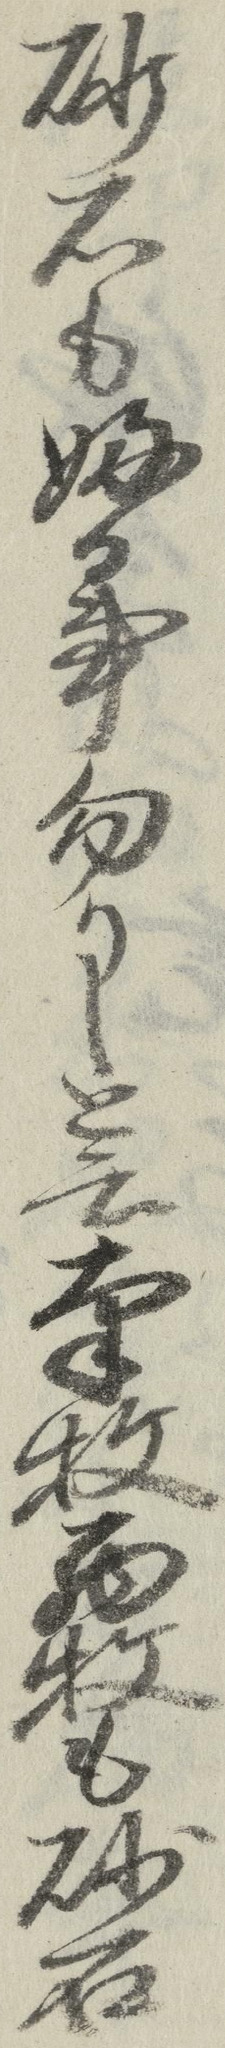砂石もふる事勿りしと云南牧西牧も砂石
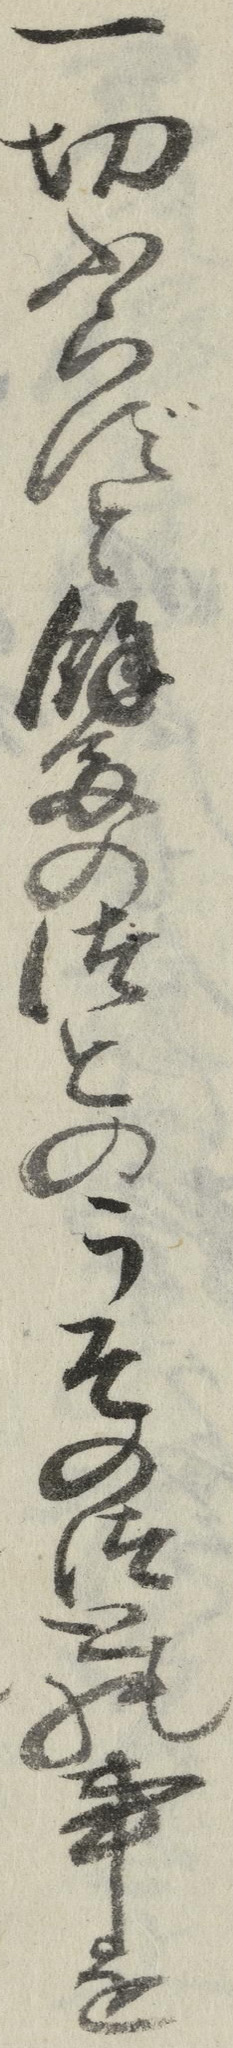一切ふらずと餘多のつとのうそのつとの事を
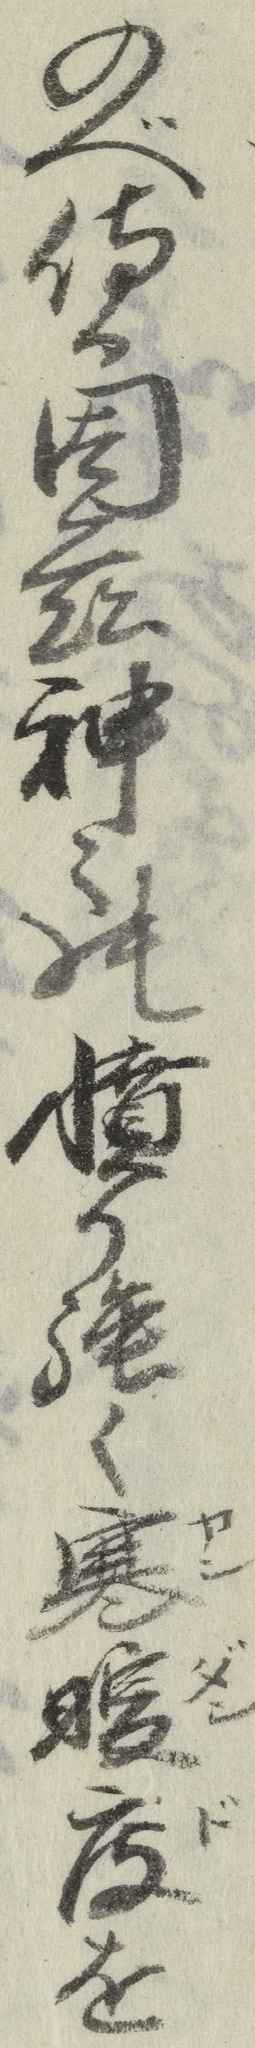のべ侍る因茲神々の憤り強く寒暖度を
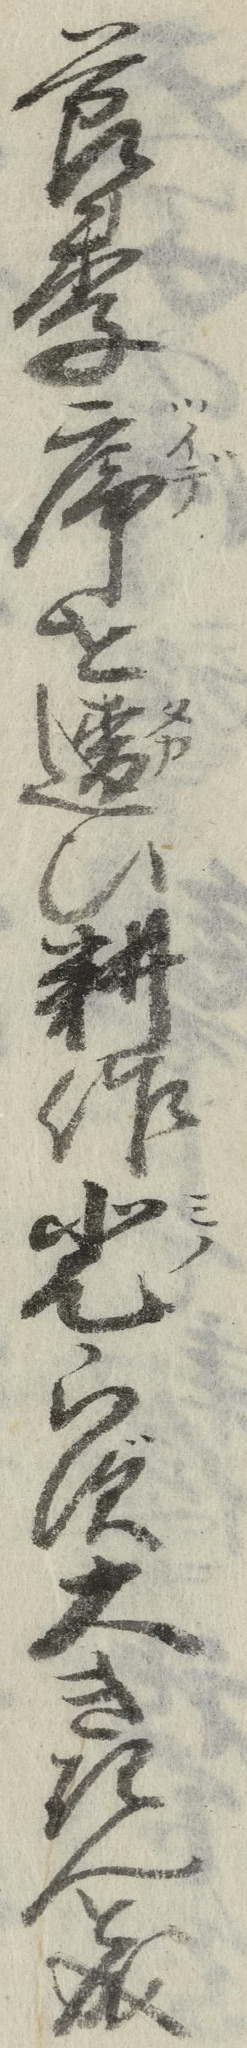節季序を違ひ耕作登らず大ききんと成
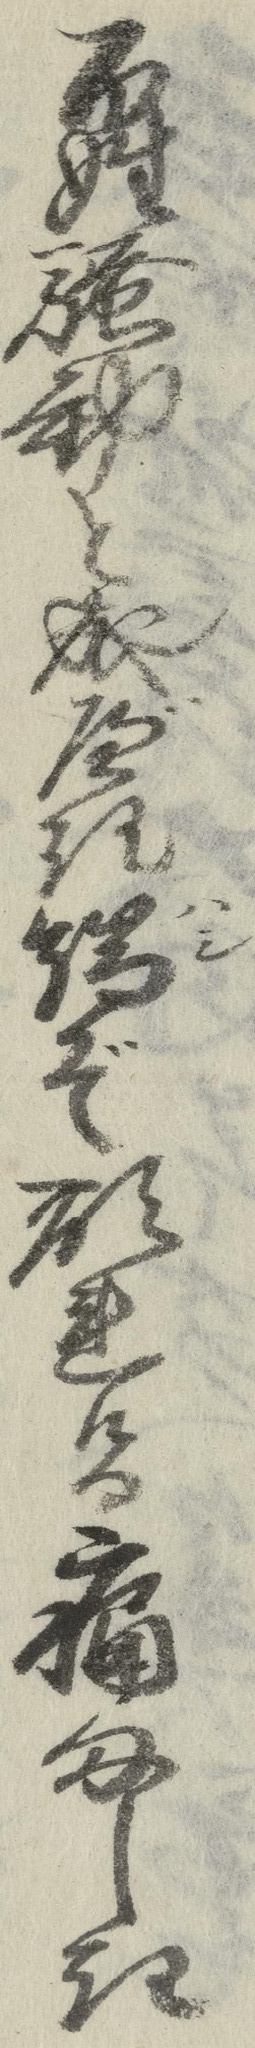百姓騒動と成べき端ぞなれける痛ましき
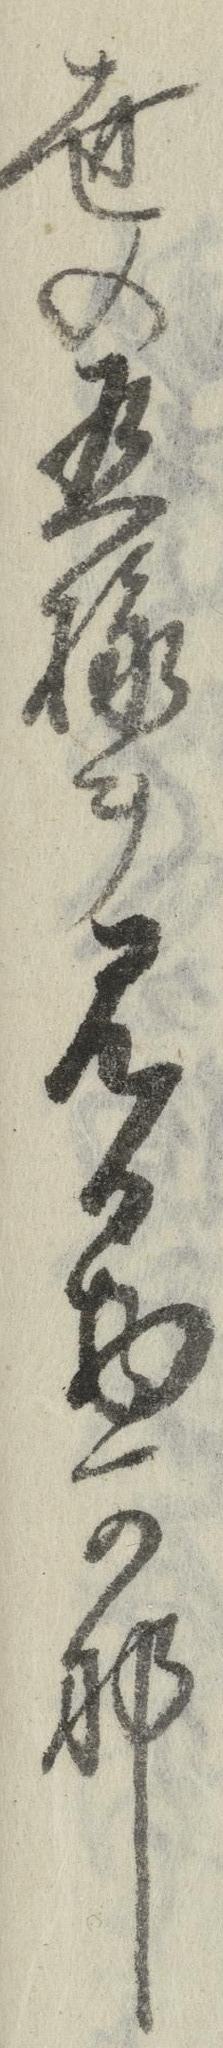世の有様ヲ見る物かな
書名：浅間大焼騒動記　上
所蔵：東京大学地震研究所図書室 Earthquake Research Institute Library, The University of Tokyo, JAPAN
